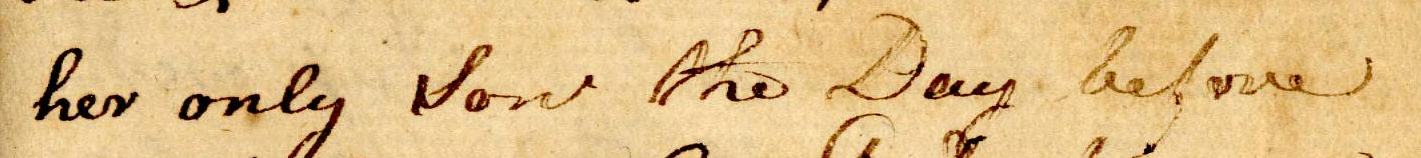her only Son the Day before
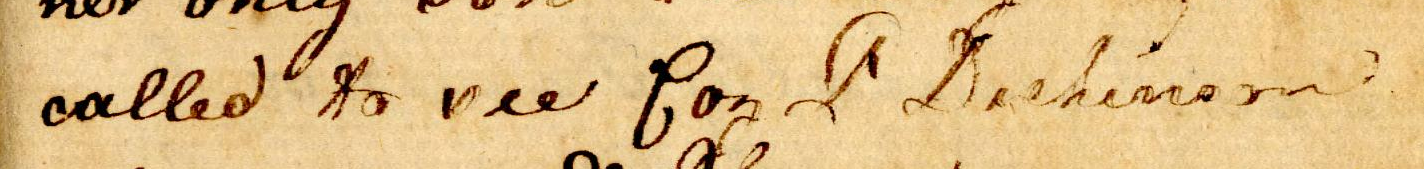called to see Coz P Dickinson
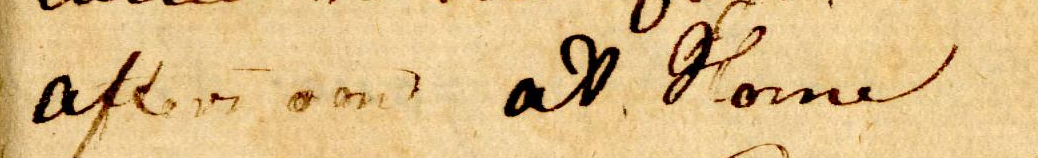Afternoon at Home
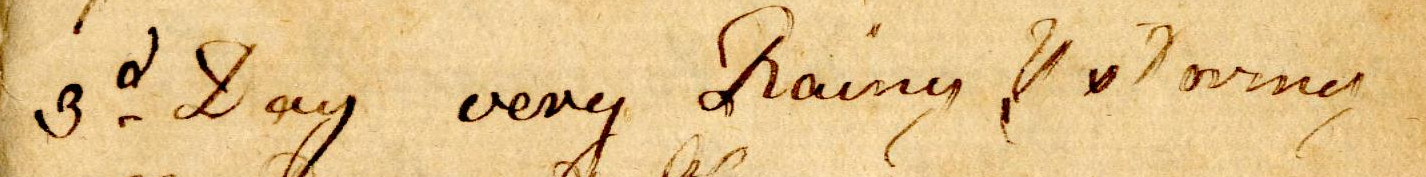3^d Day, very Rainy & stormy
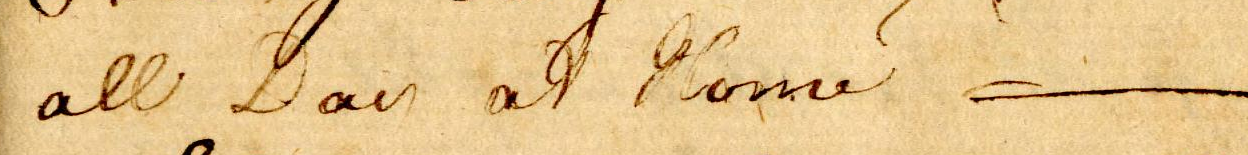all Day at Home-
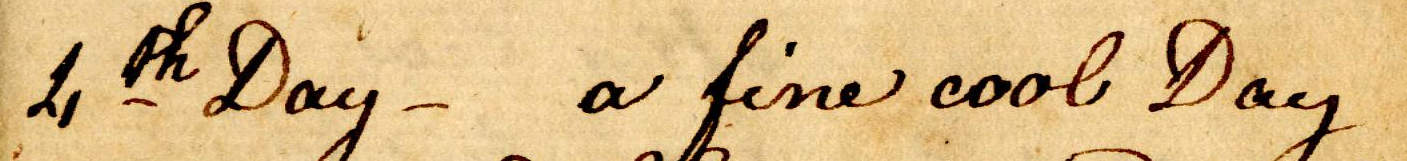4^th Day- a fine cool Day
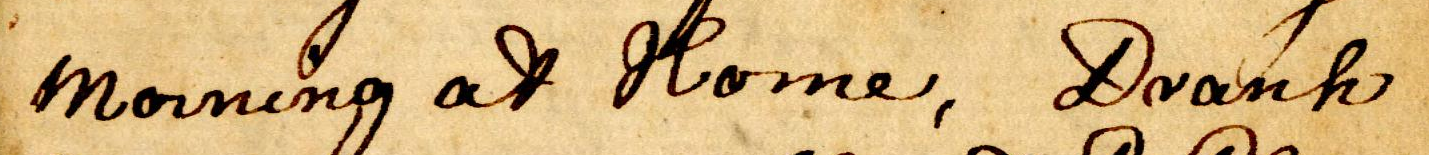Morning at Home, Drank
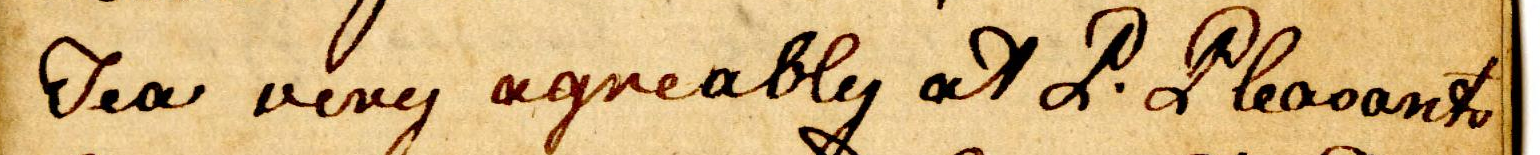Tea very agreably at P. Pleasants
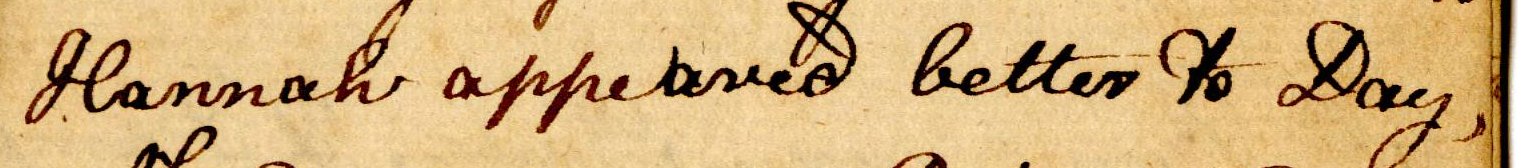Hannah appeared better to Day,
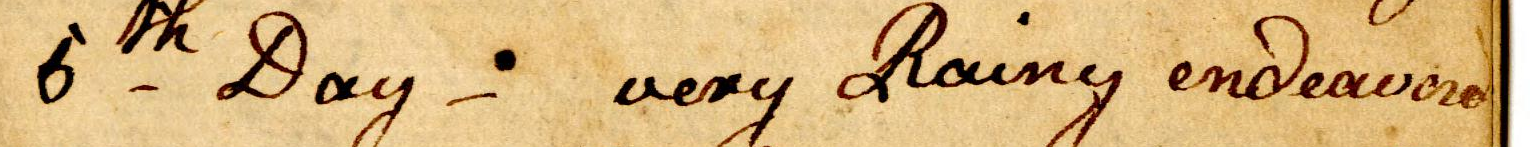5^th Day- very Rainy endeavord
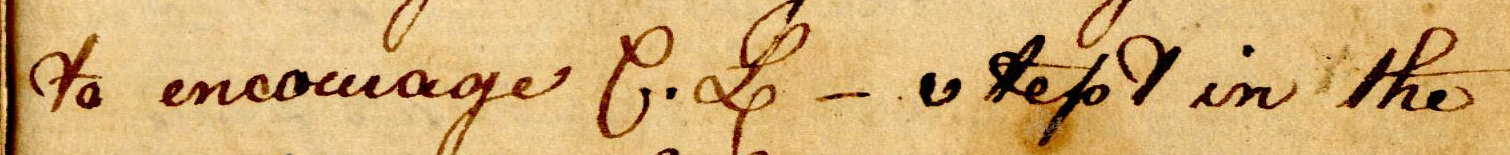to encourage C.L- stept in the
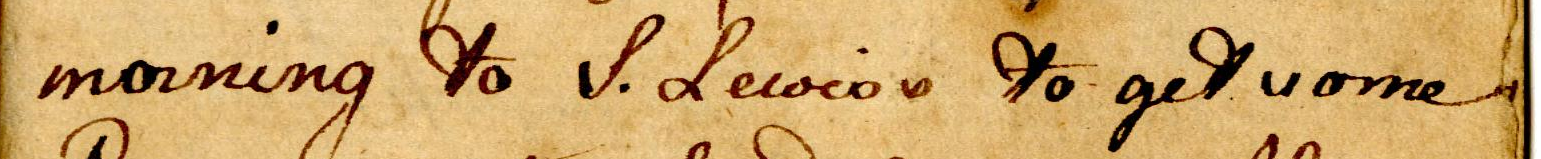morning to S. Lewis s to get some
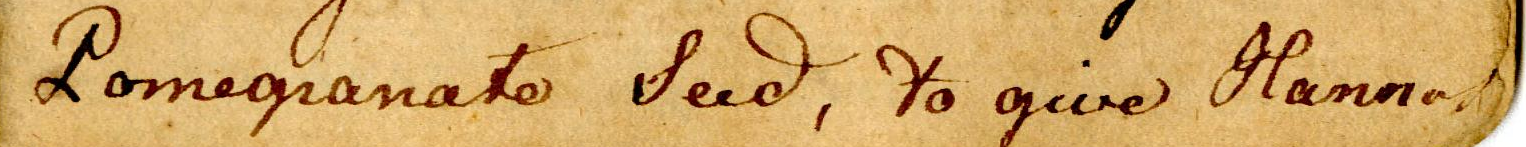Pomegranate Seed, to give Hannah
